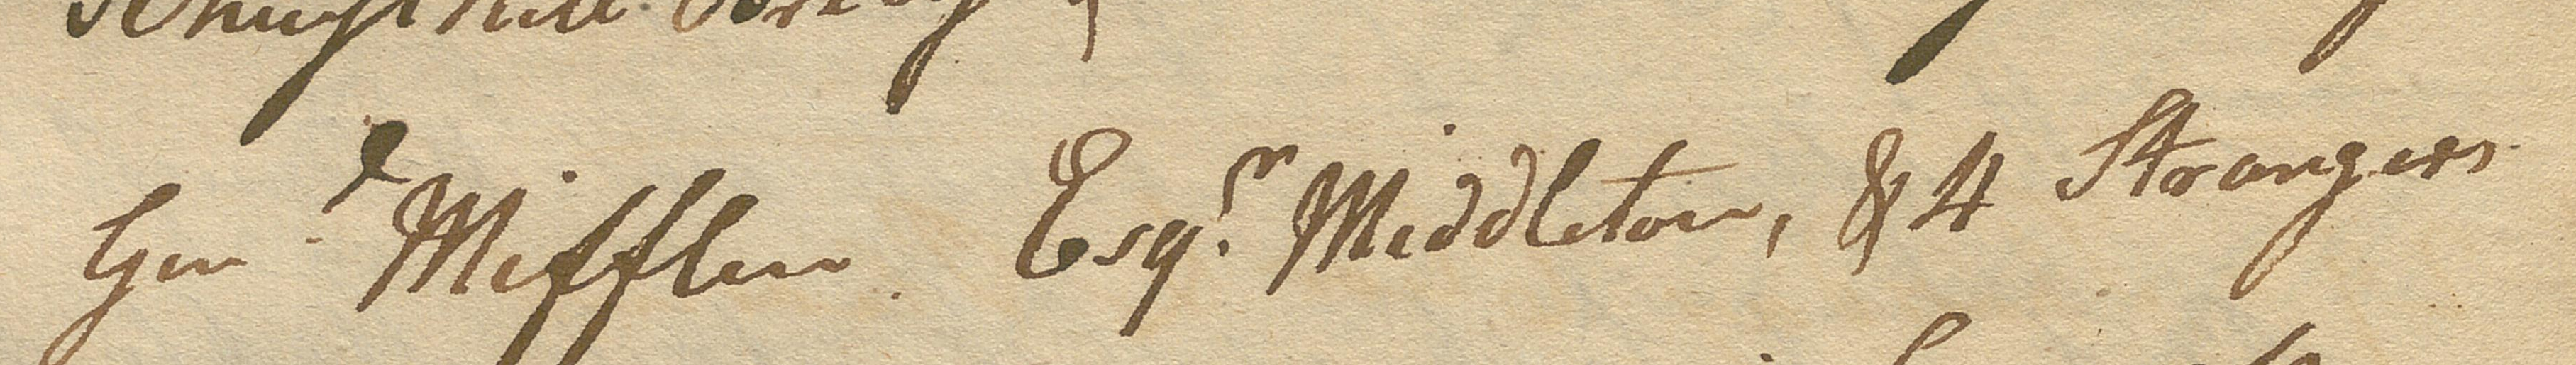Gen^l Mifflin Esq^r. Middleton, & 4 Strangers
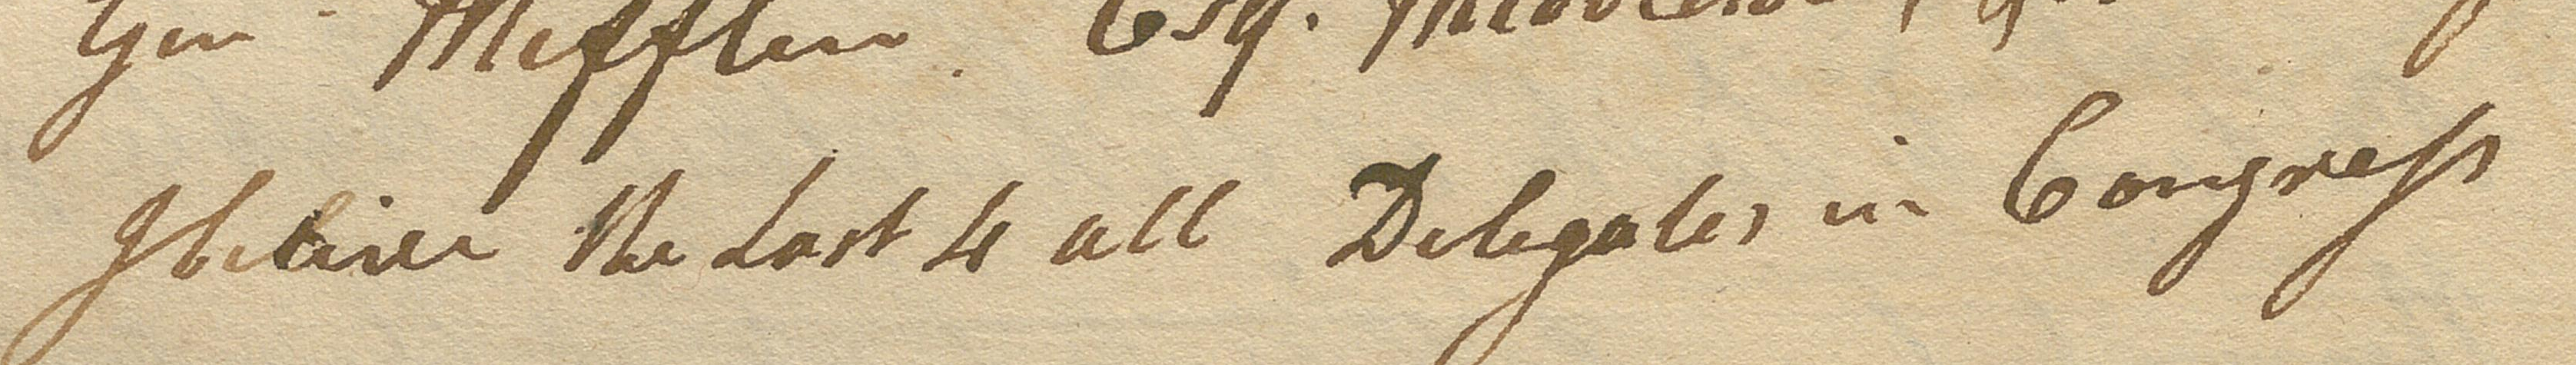I belive the Last 4 all Delegates in Congress
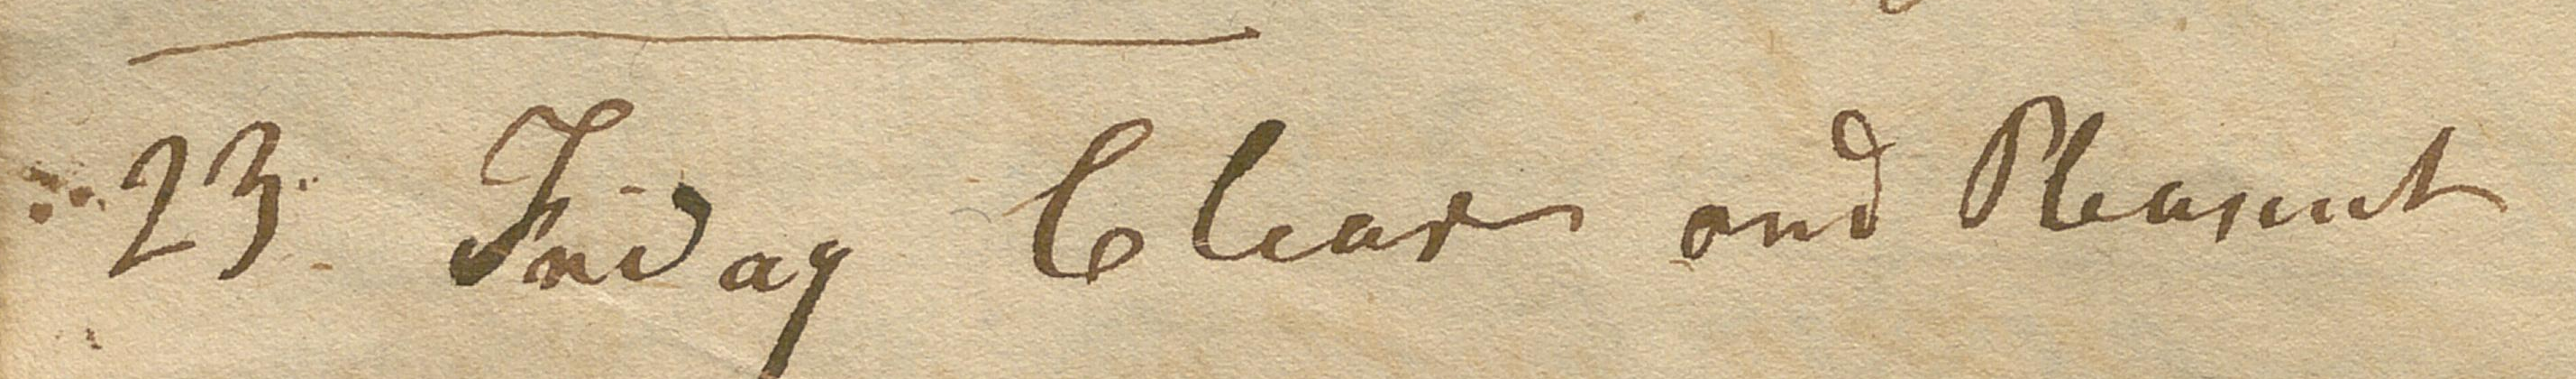23 Friday Clear and Pleasent
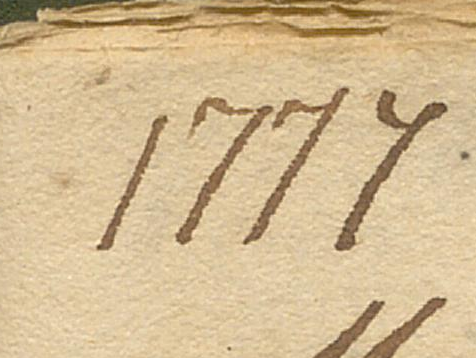1777
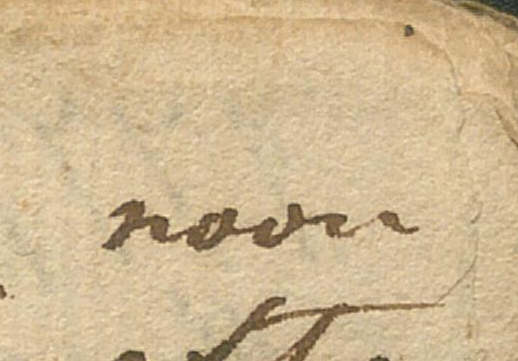noon
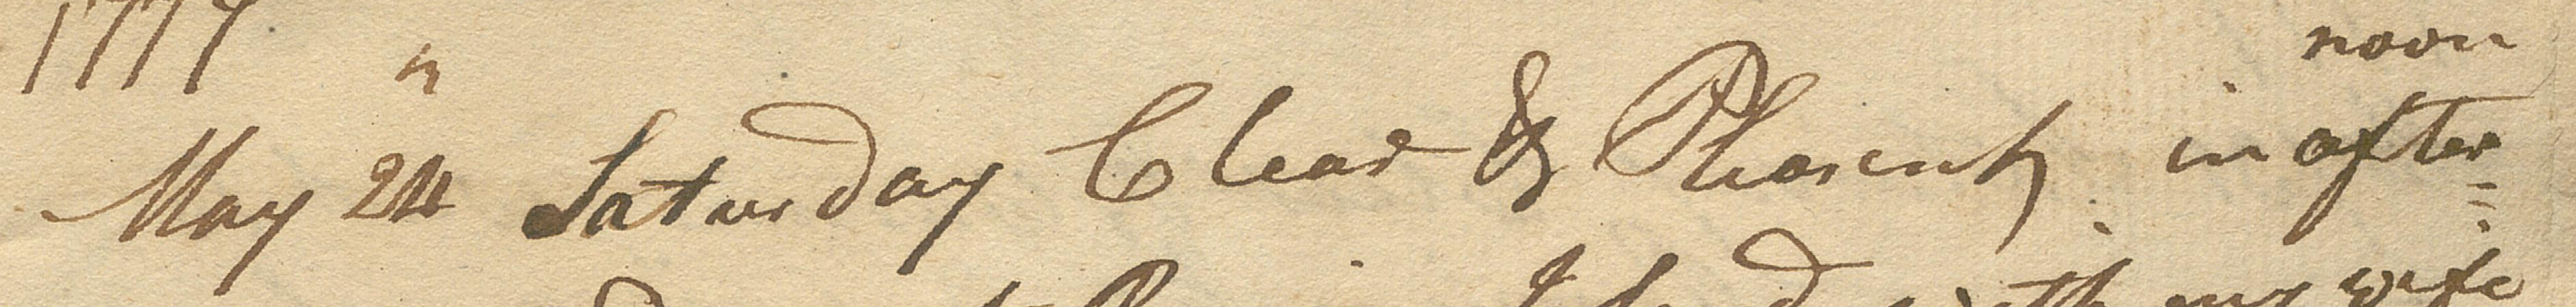May 24^th Saturday Clear & Pleasent in after
